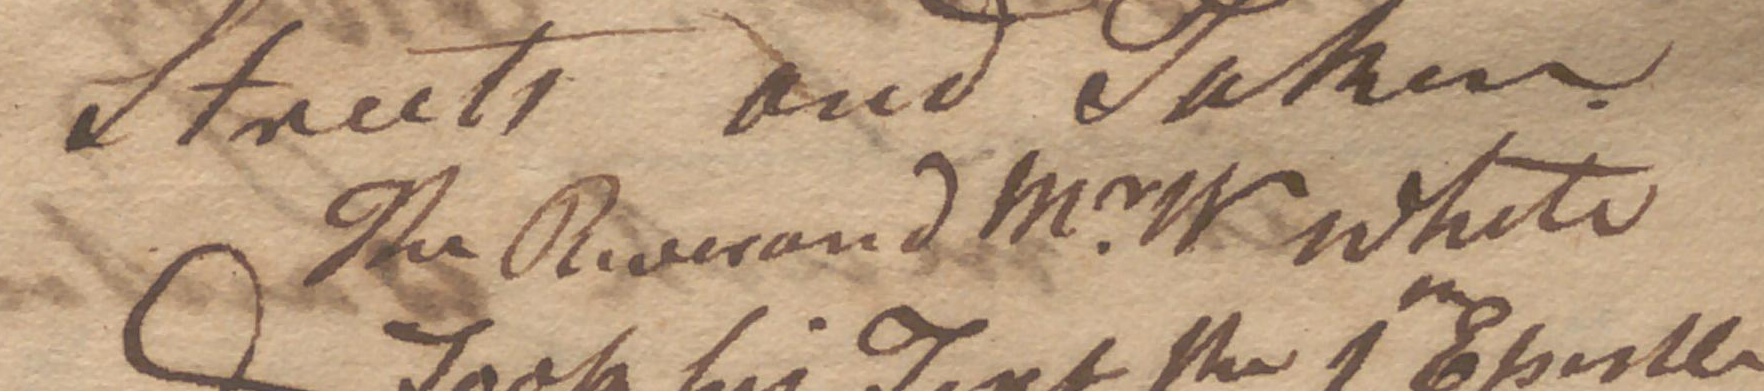The River and M^r. W white
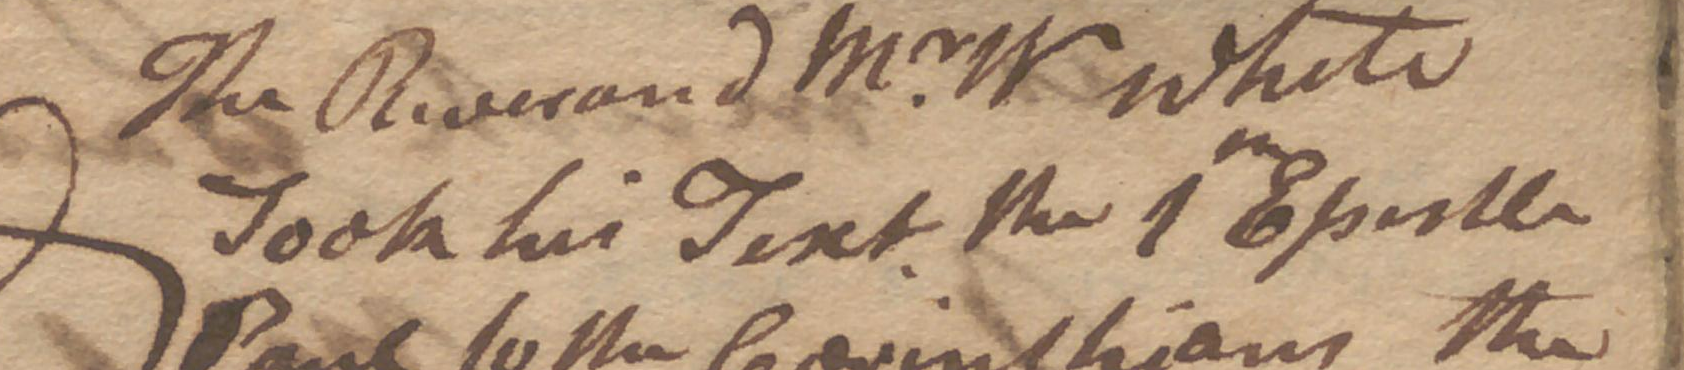Took his Text the 1^th Epistle
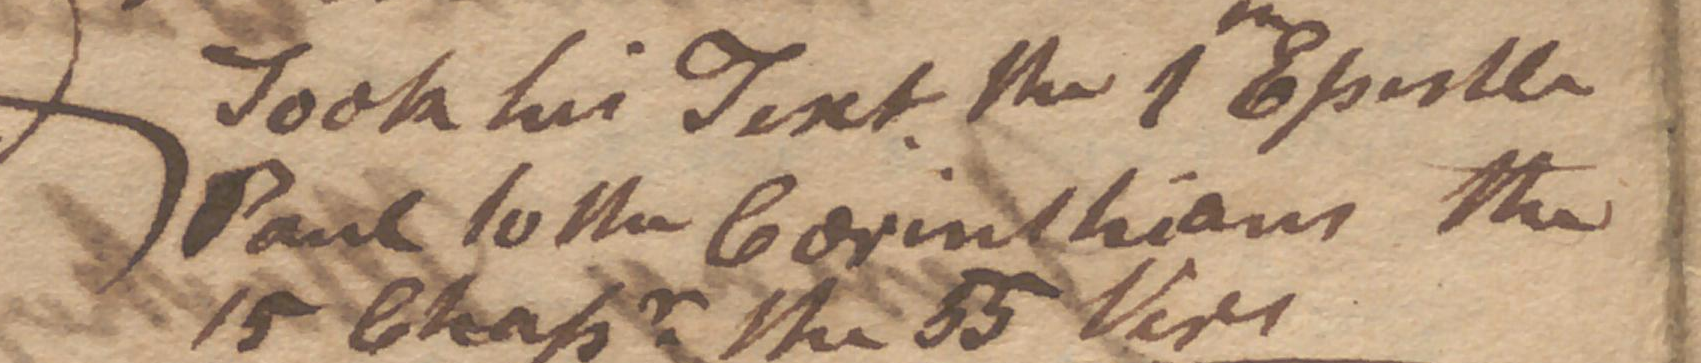Paul to the Corinthians the
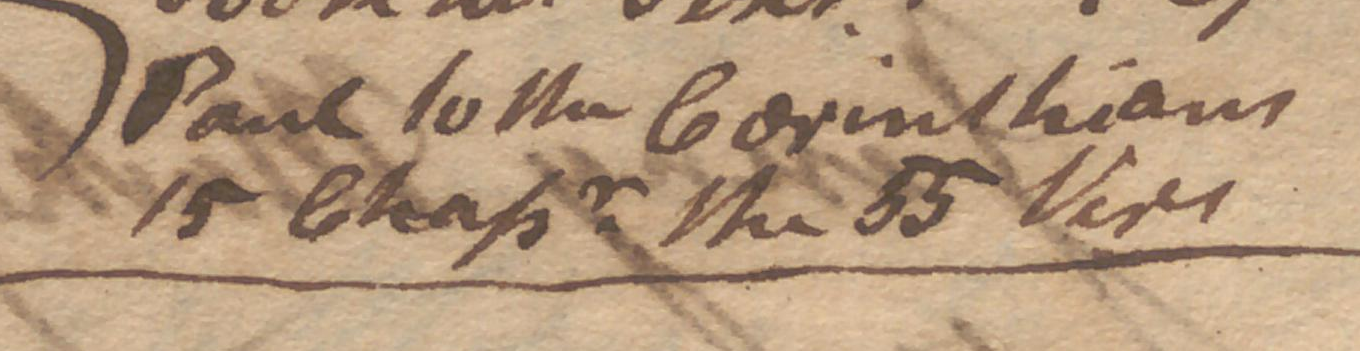15 Chap^r the 55 Vers
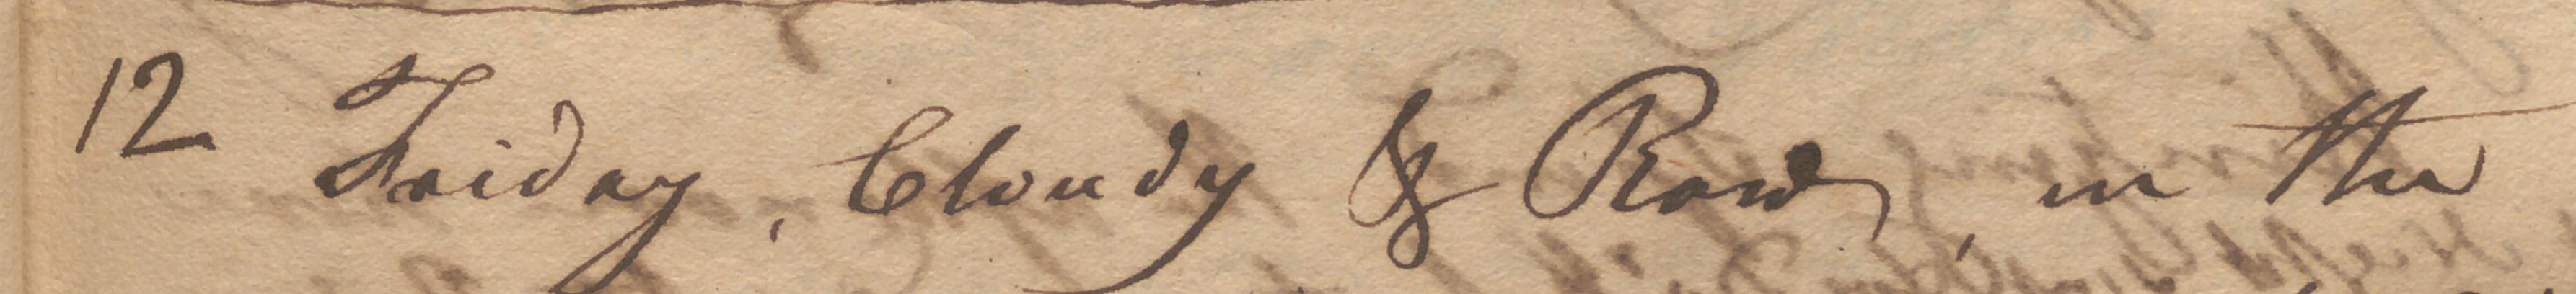12^th Friday Cloudy & Raw, in the
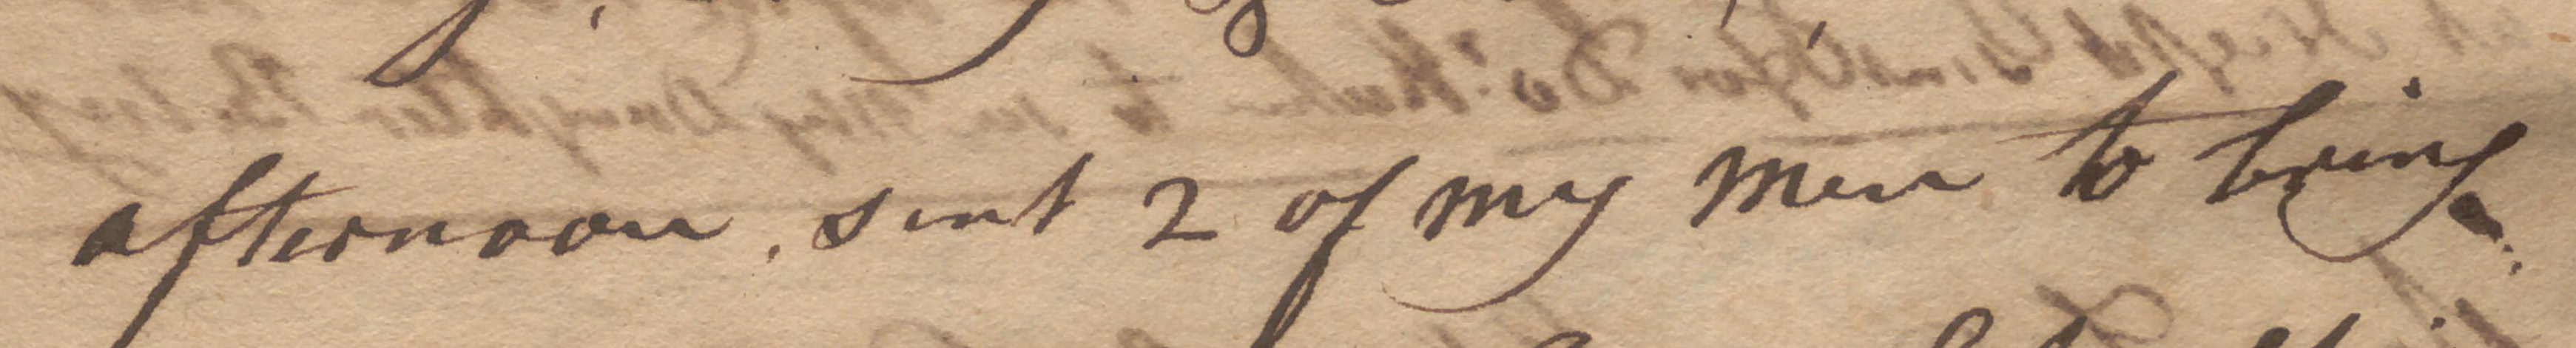afternoon. sent 2 of my men to bring
